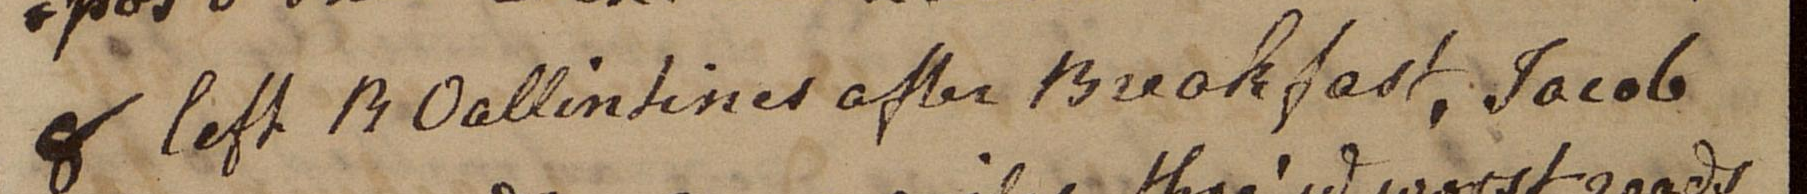8 left R Vallintines after Breakfast, Jacob
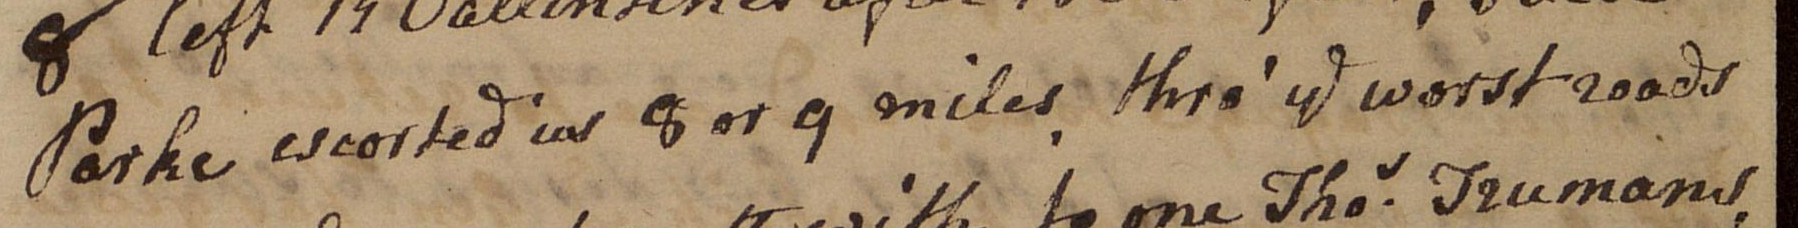Parke escorted us 8 or 9 miles, thro' y^e worst roads
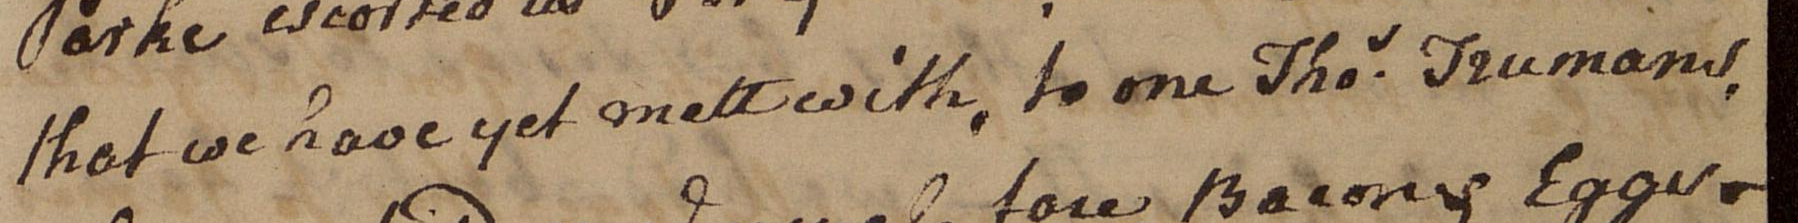that we have yet mett with, to one Tho^s. Trumans,
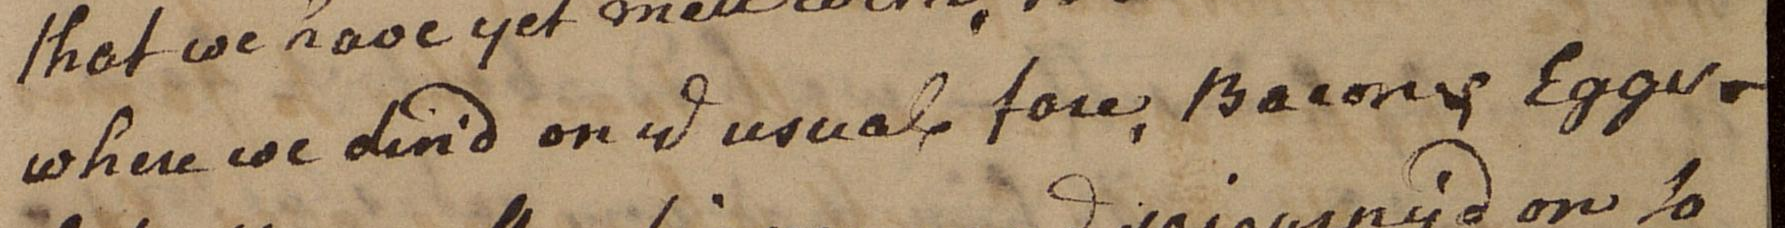where we din'd on y^e usual fore, Bacon & Eggs-
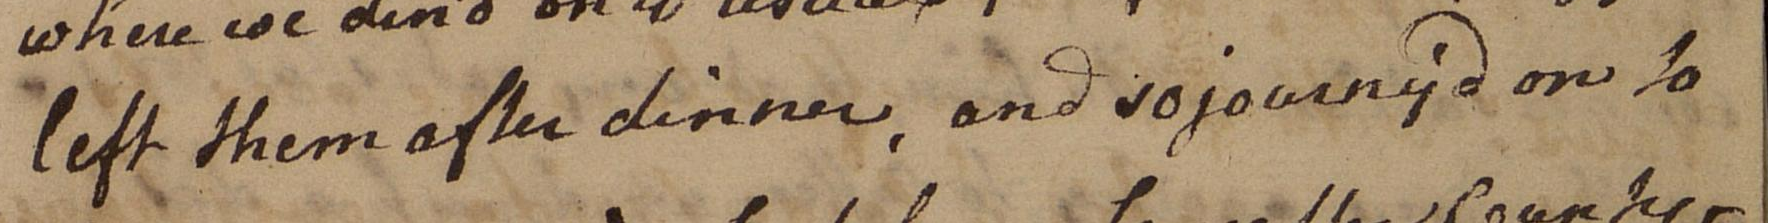left them after dinner, and so journy'd on to
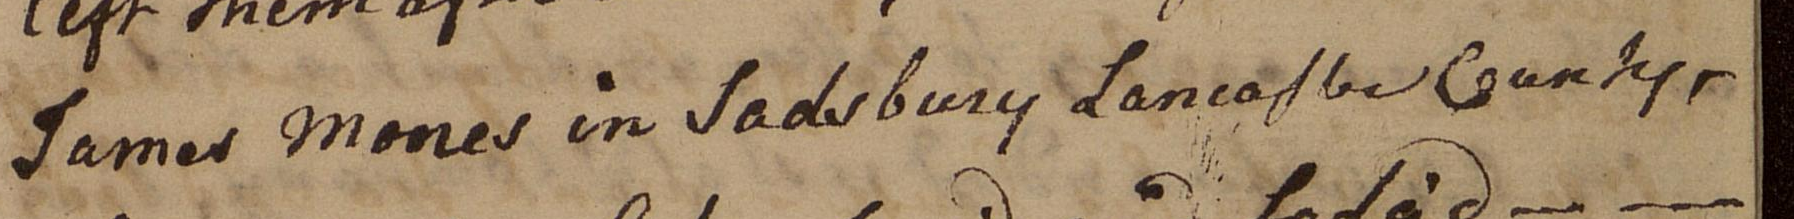James Mones in Sadsbury Lancaster County-
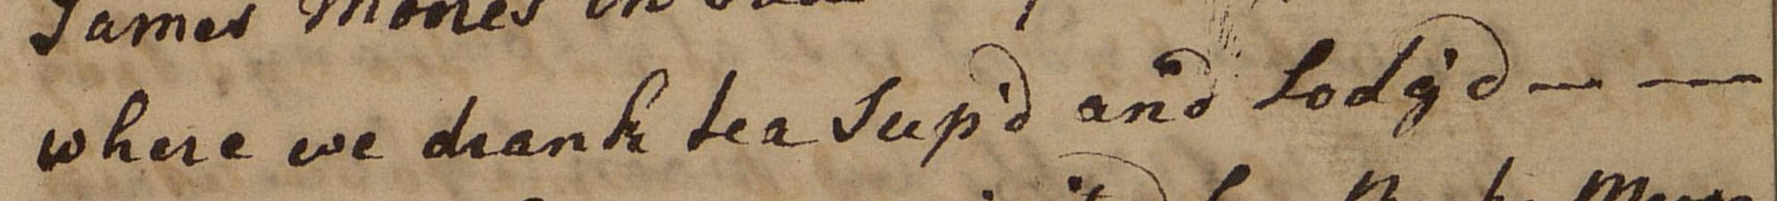where we drank tea Sup'd and lodg'd--
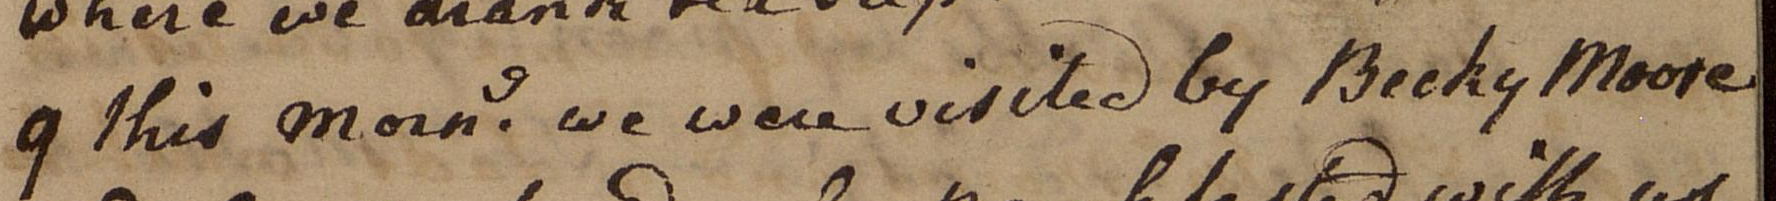9 this morn^g. we were visited by Becky Moore
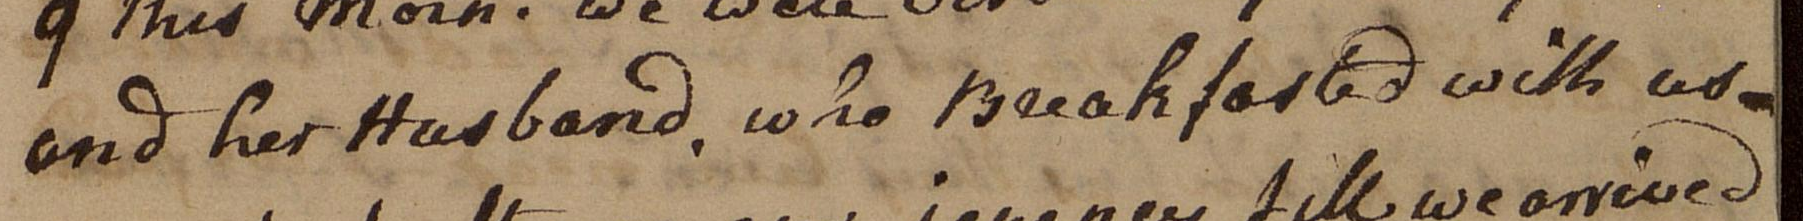and her Husband, who Breakfasted with us-
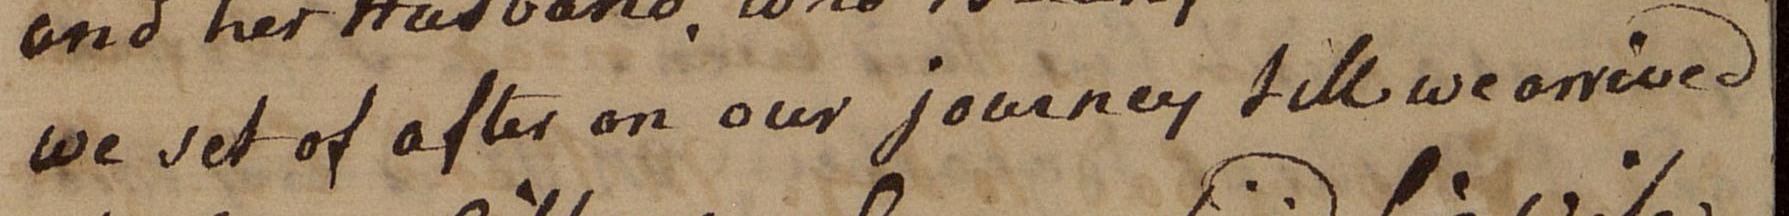we set of after on our journey till we arrived
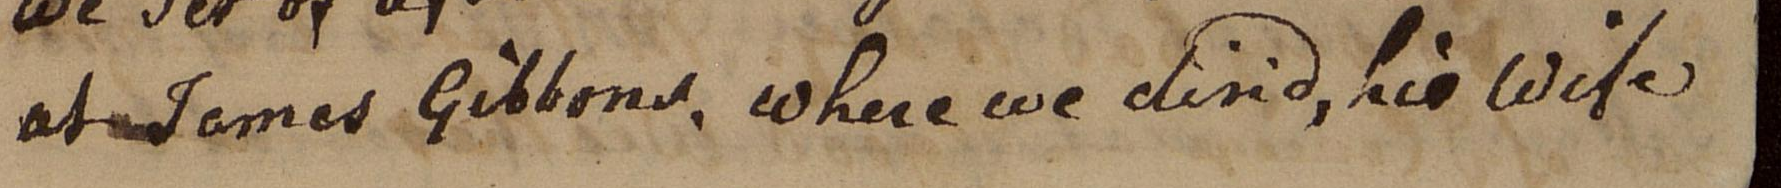at- James Gibbons. where we din'd, his Wife
